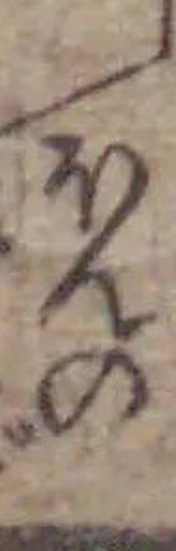ほんの

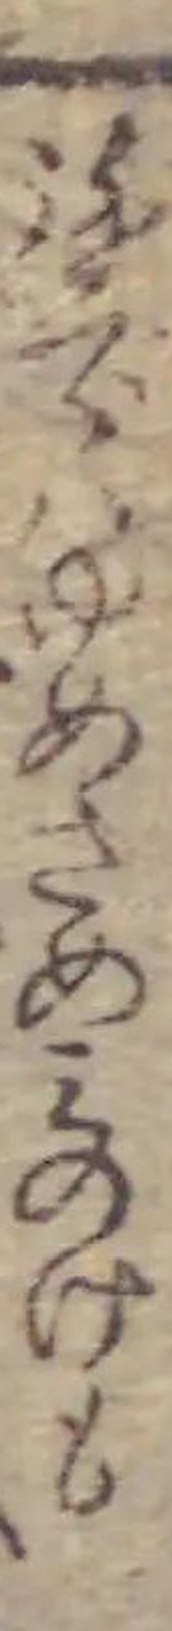弥二郎はゆめさめみのけも
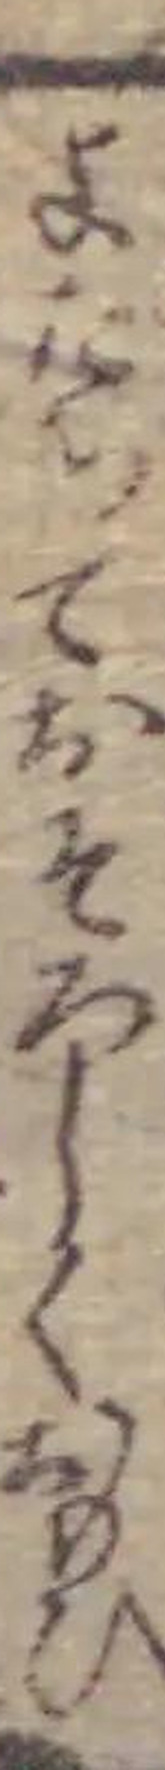よだちておそろしくおもひ
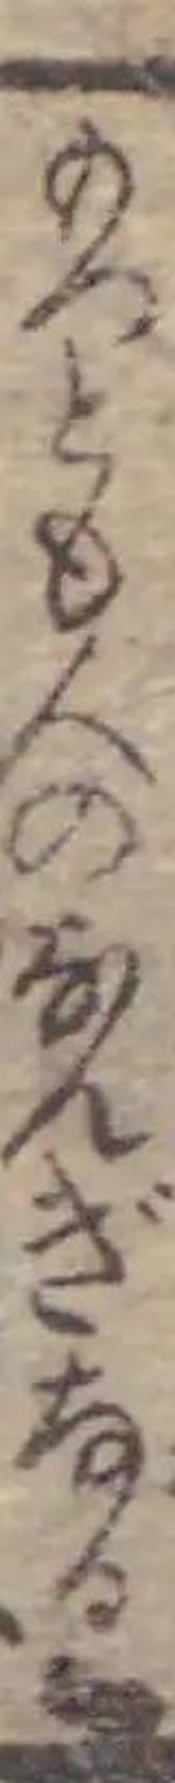もつとも人のなんぎなる
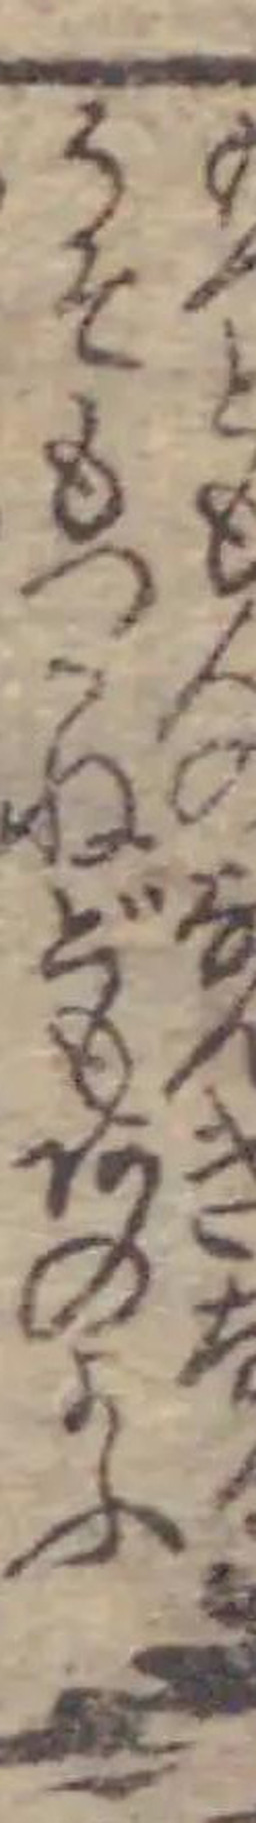うそもつかねどもあのよふ
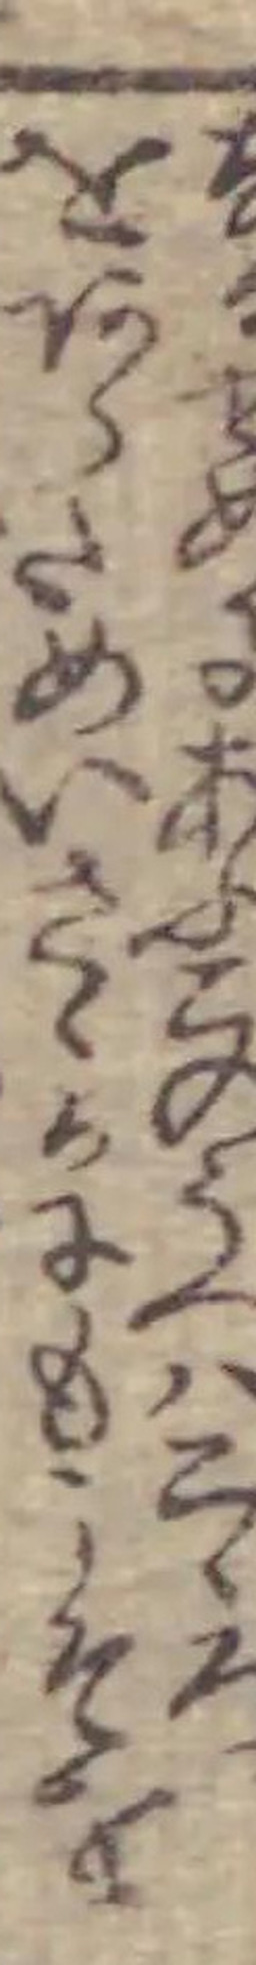をあらためいさゝかにもうそを
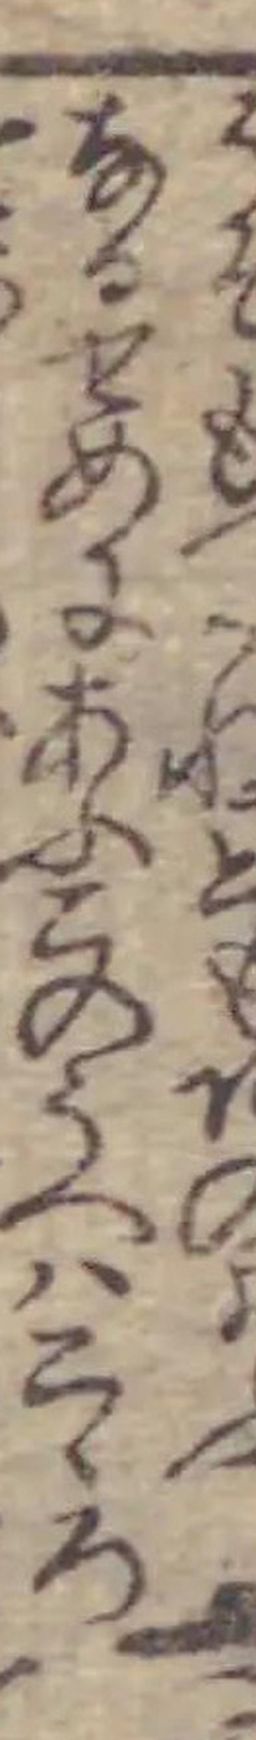なるせめにあふこのうへはこゝろ
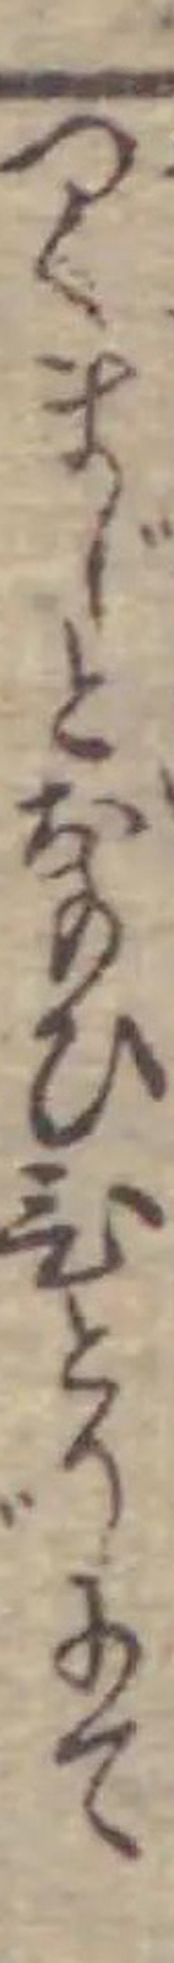つくまじとおもひひとりにて
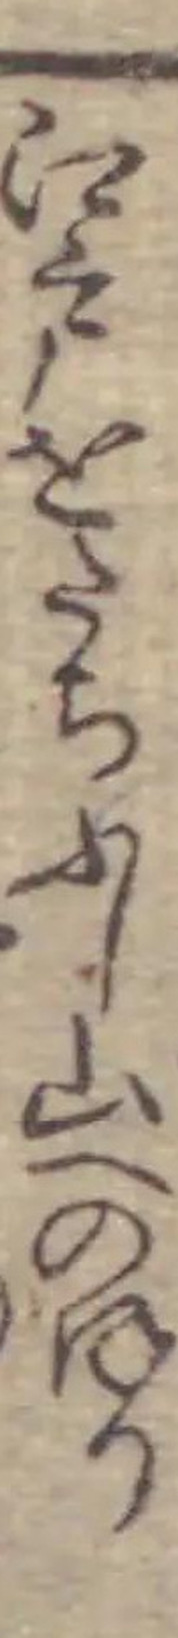江戸をたちふし山へのぼり
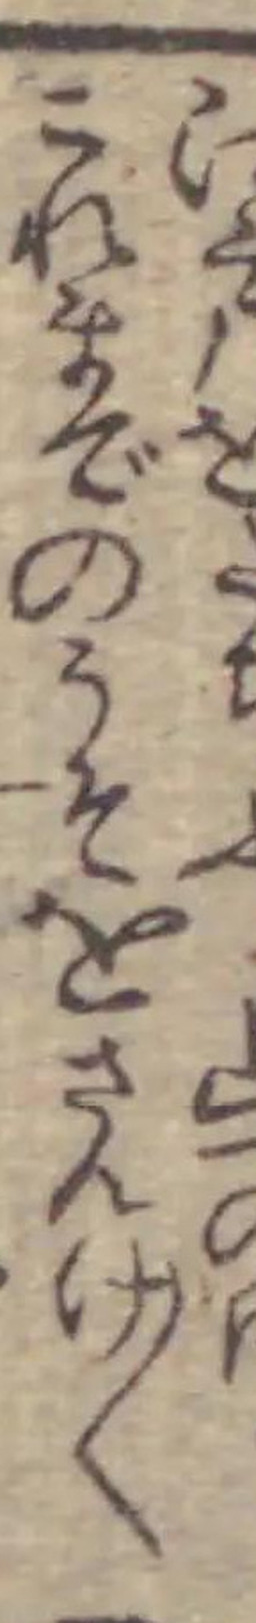これまでのうそをさんけ〳〵
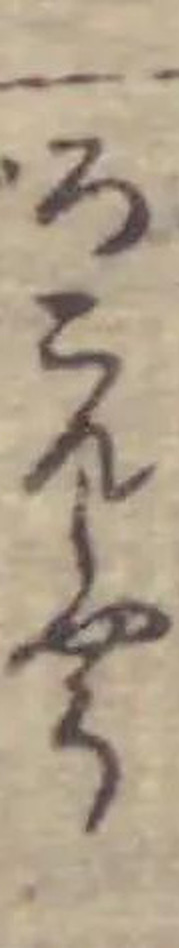ろこんしやう
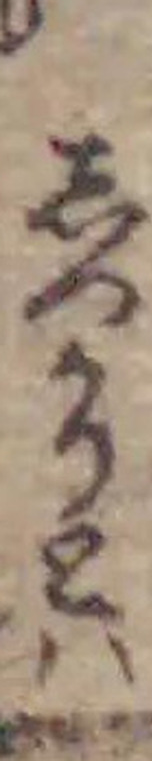しつかりとは
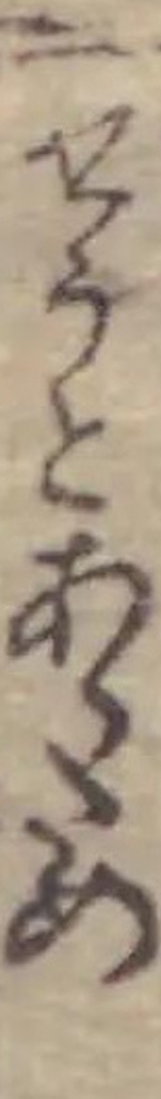ぜうとあらため
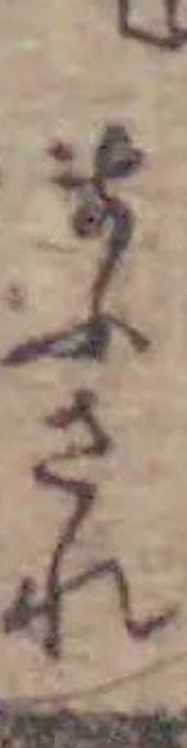まふされ
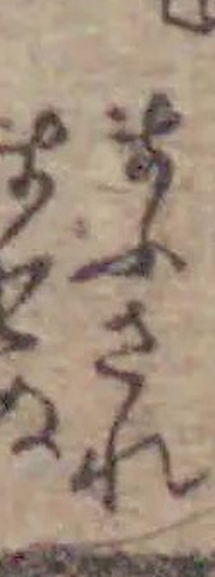ませぬ
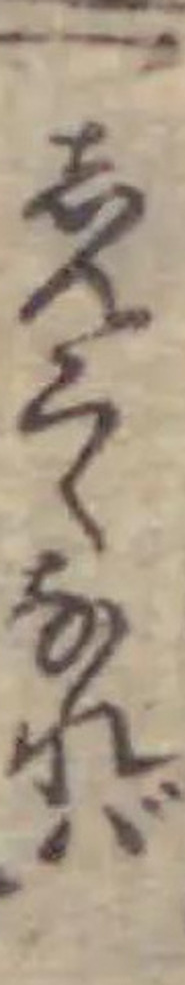しんこくなれば
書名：虚言弥二郎傾城誠 3巻
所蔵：国立国会図書館 National Diet Library, JAPAN
